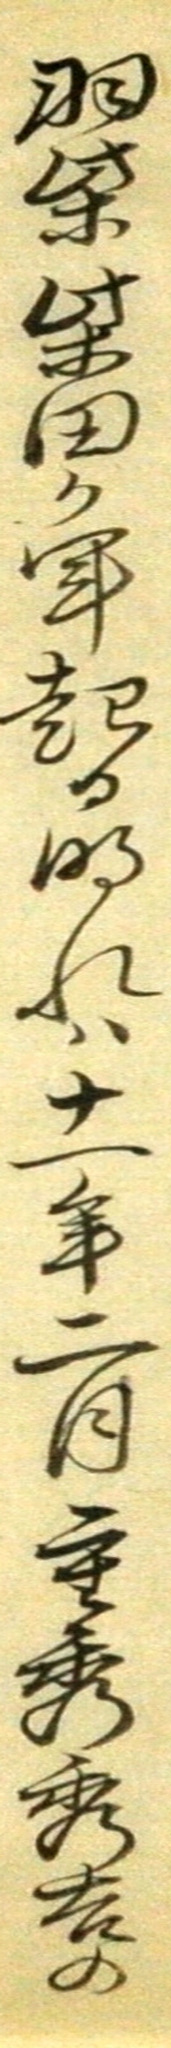羽柴柴田か軍起る明れは十一年二月重秀秀吉の
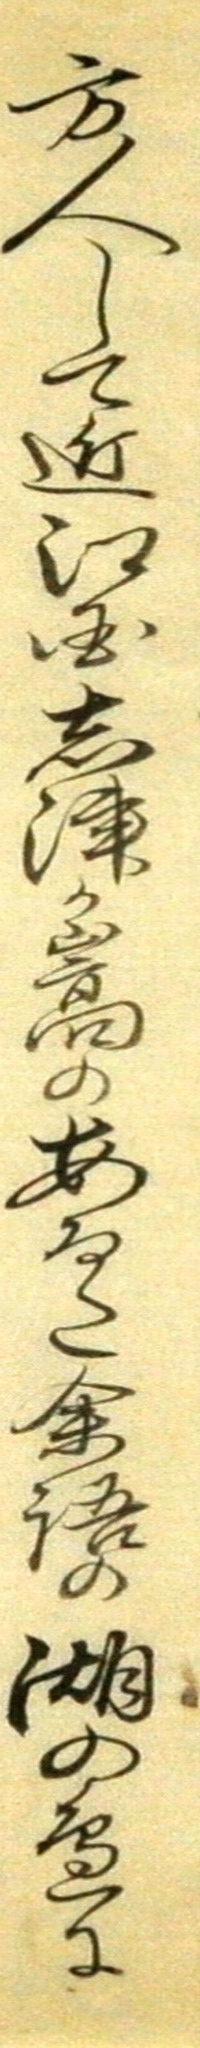方人して近江国志津か嵩のあなた余語の湖の辺に
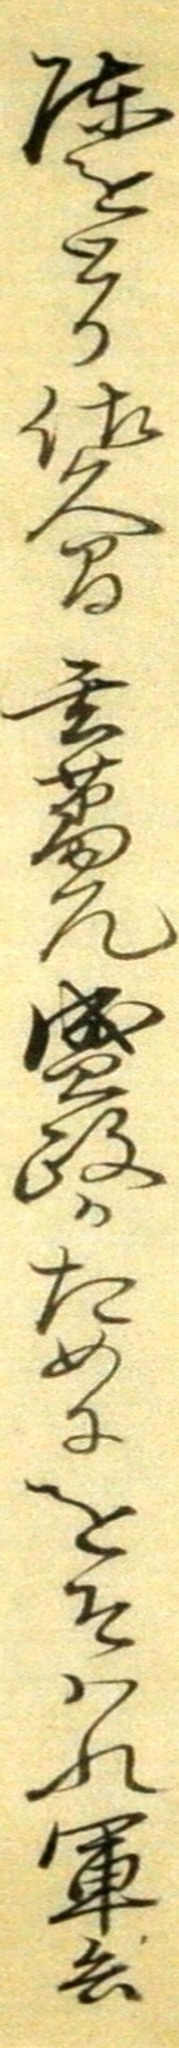陣をとり佐久間玄蕃允盛政かためにをそはれ軍兵
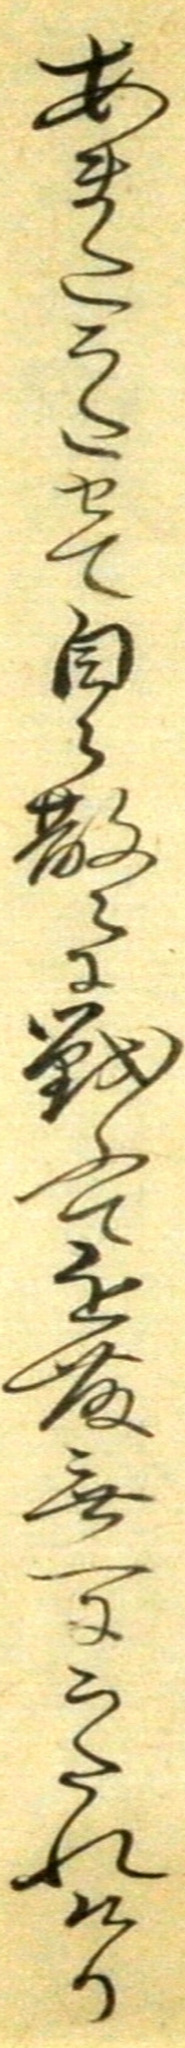あまたうたせて自ら散々に戦ふて近藤無一にうたれけり
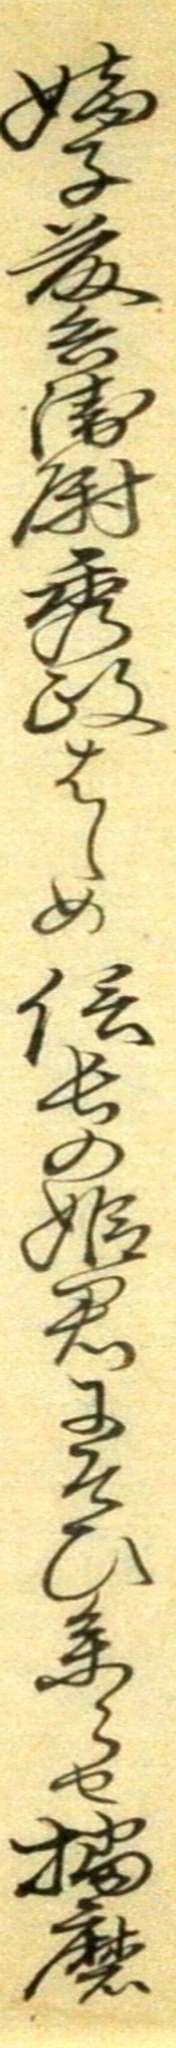嫡子藤兵衛尉秀政はしめ信長の姫君にそひ参らせ播磨
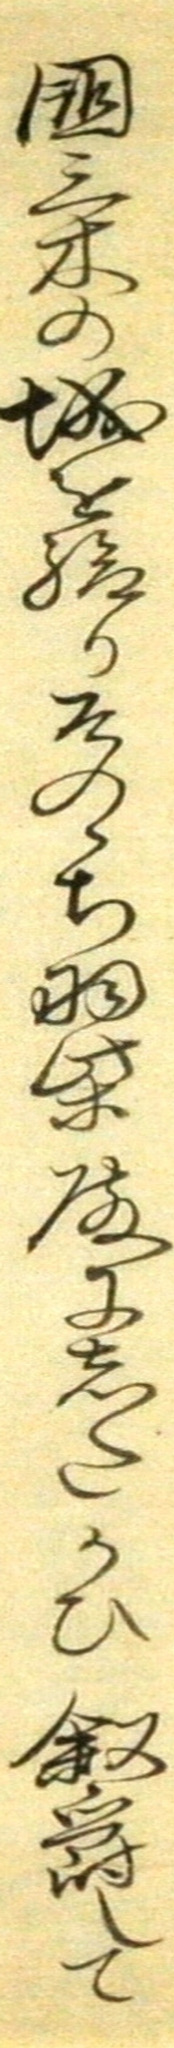国三木の城を給りそのゝち羽柴殿にしたかひ叙爵して
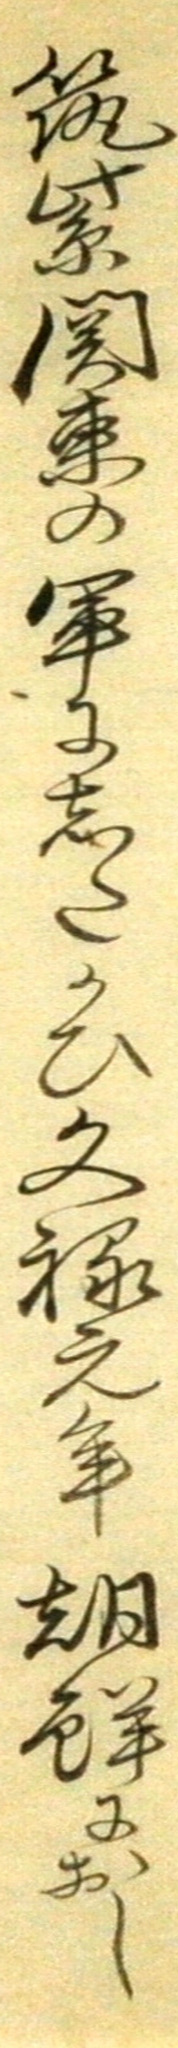筑紫関東の軍にしたかひ文禄元年朝鮮におし
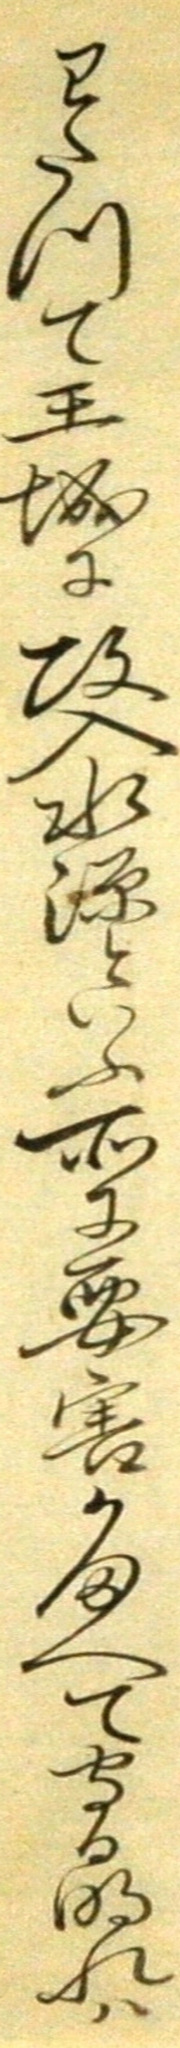わたつて王城に攻入水源といふ所に要害かまへて守る明れは
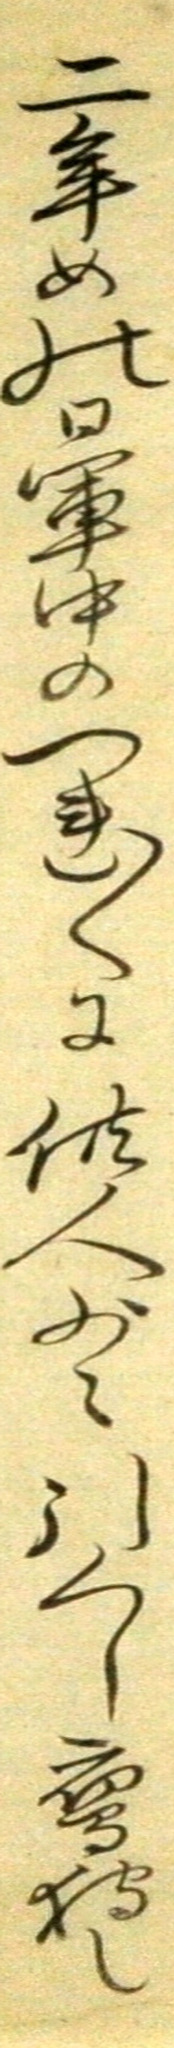二年めの日軍中のつれ〳〵に供人少々引くし鷹狩し
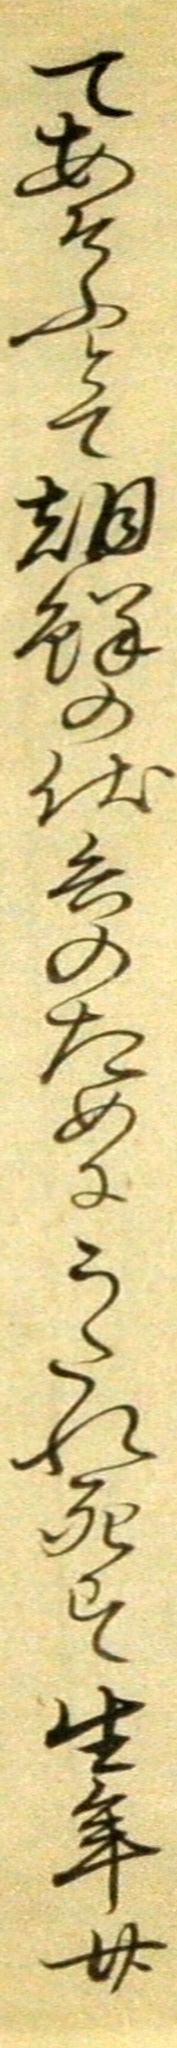てあそふとて朝鮮の伏兵のためにうたれ死す生年廿
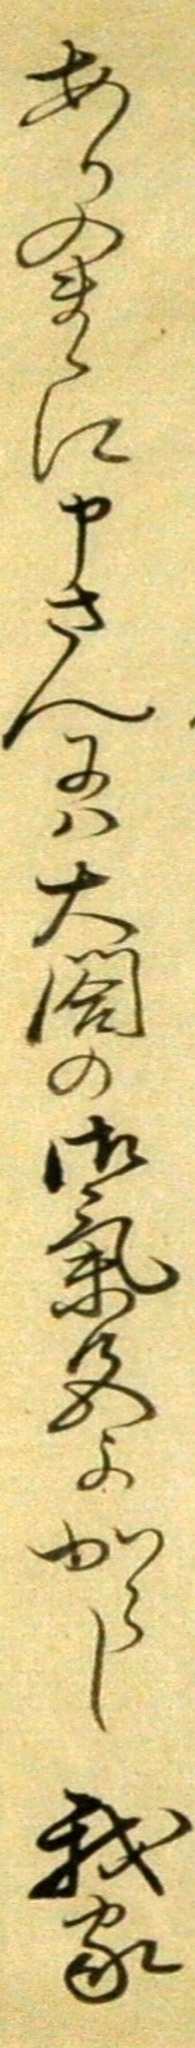ありのまゝに申さんには大閤の御気色よからし我家
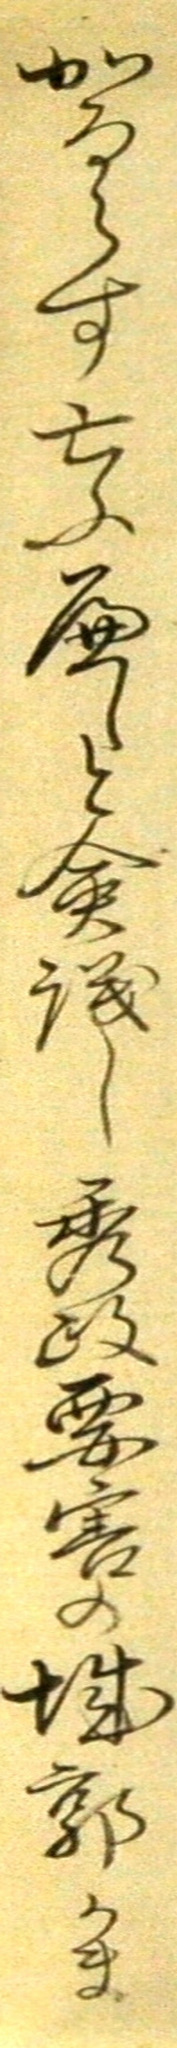かならす亡ふへしと僉議し秀政要害の城郭かま

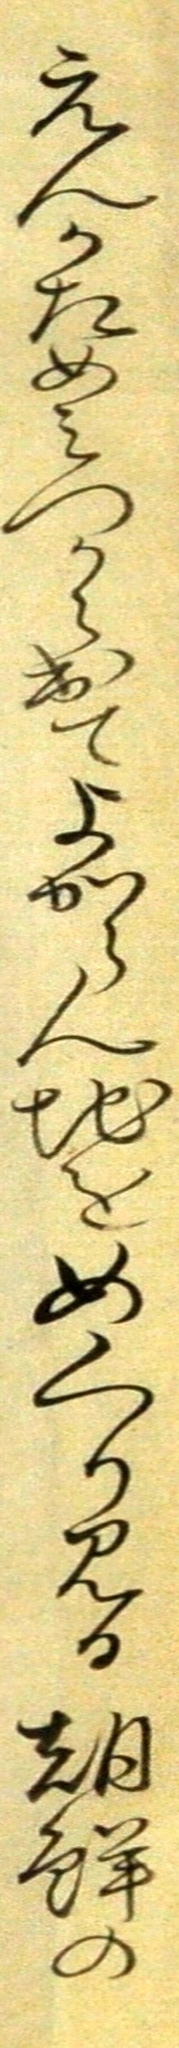えんかためみつから出てよからん地をめくり見る朝鮮の
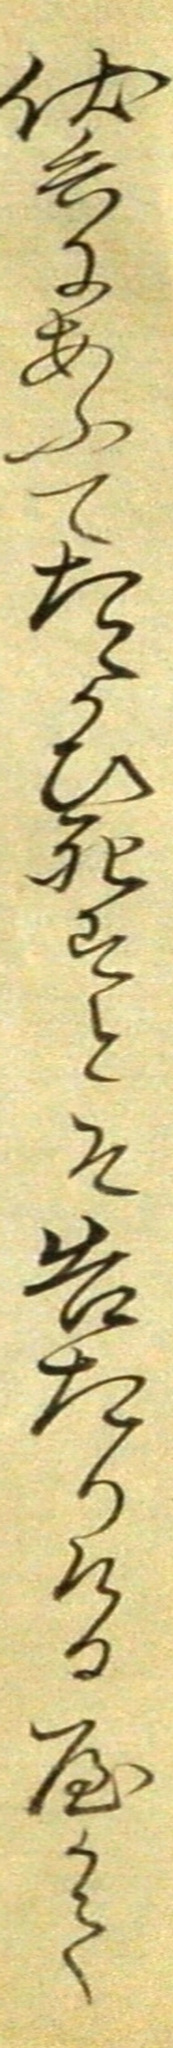伏兵にあふてたゝかひ死すとそ告たりけるやかて
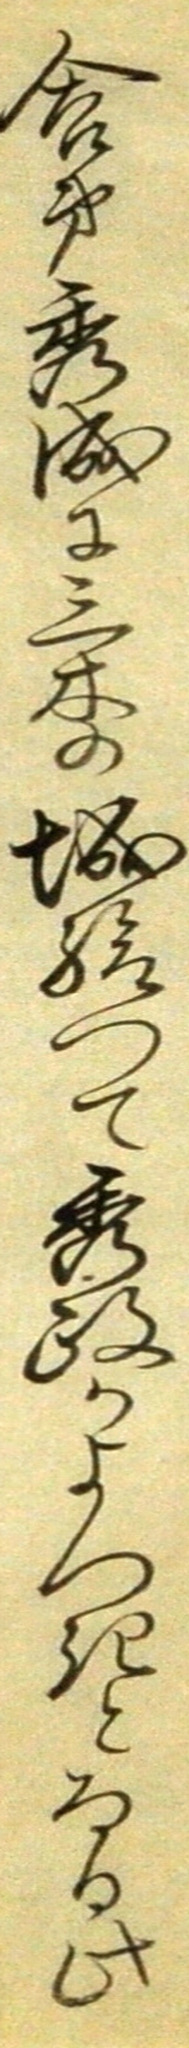舎弟秀成に三木の城給つて秀政かよつきとなる此
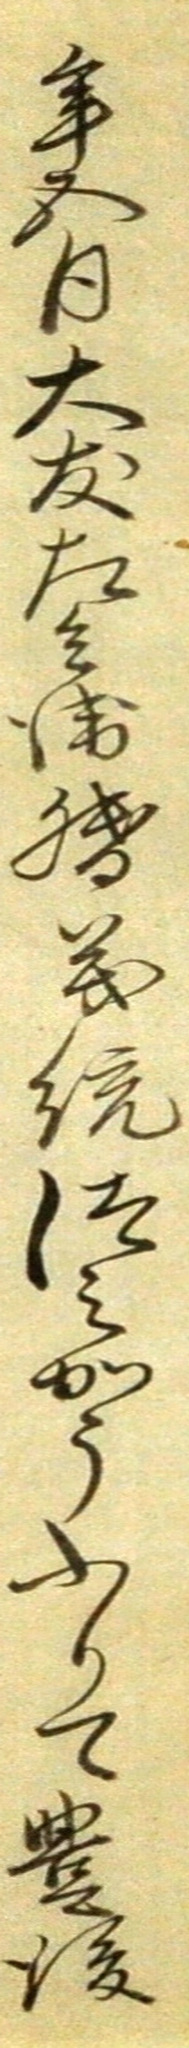年五月大友左兵衛督義統つみかうふりて豊後
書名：藩翰譜（九・下）
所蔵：伊那市立高遠町図書館・合同会社AMANE
